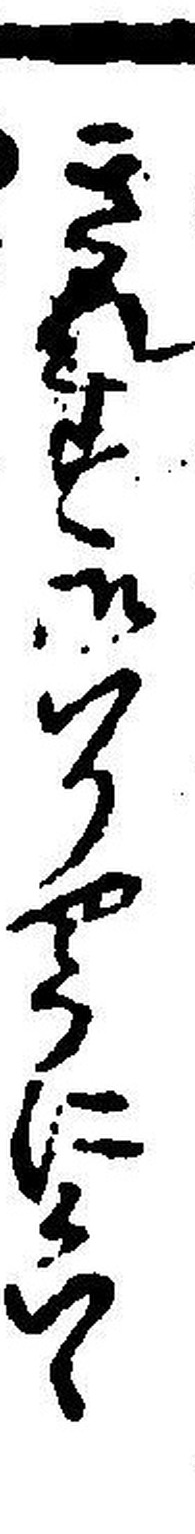きんす御いりやうに候はゝ
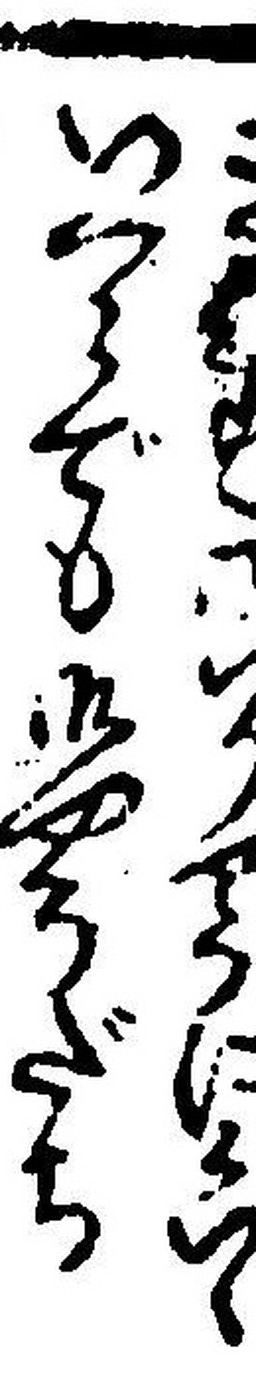いくらでも御やうだち
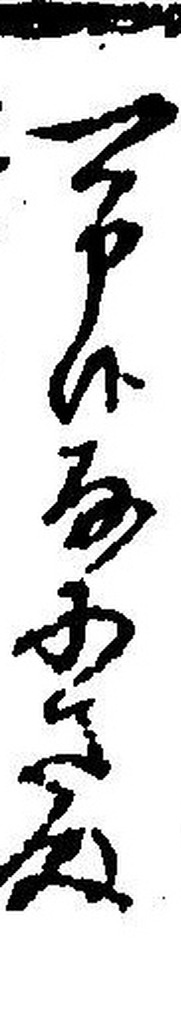可申候なにさま
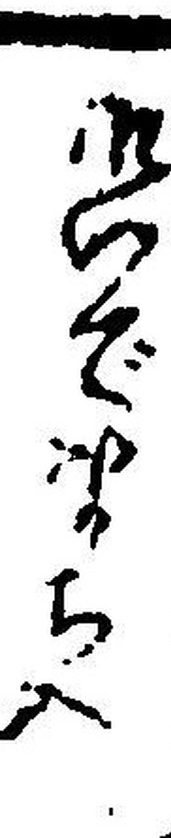御いでまち候

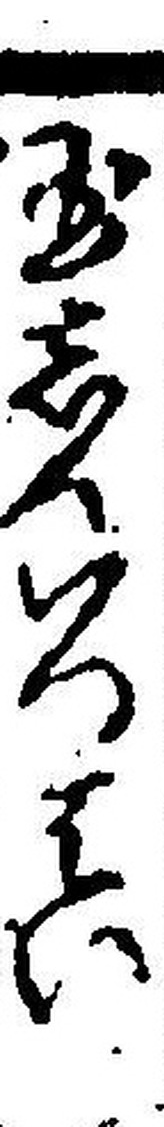玉しんいつはい
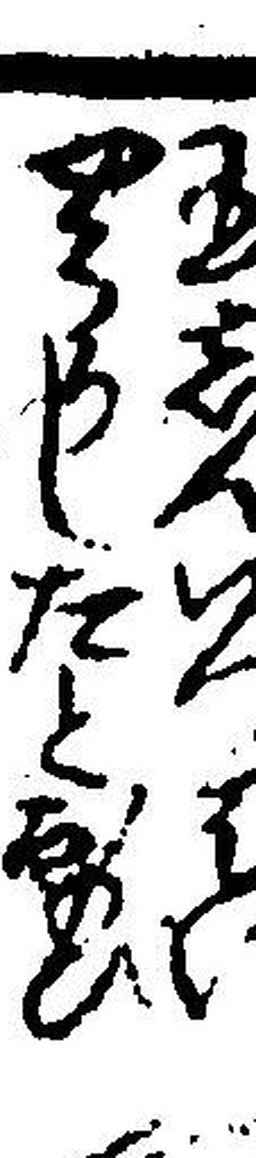やらかしたとおもひ
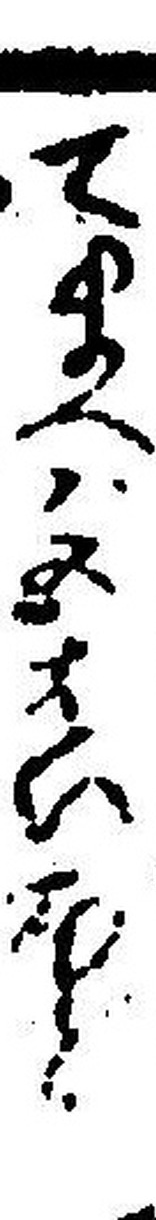てまへは又？はいほど
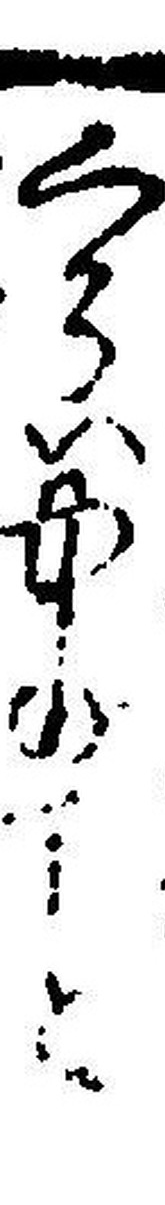くらい中の丁と
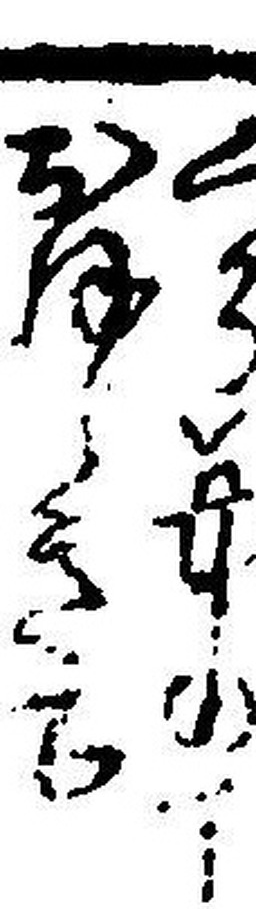おほしき所
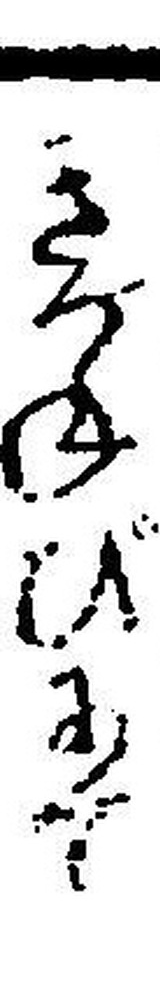きつねびにて
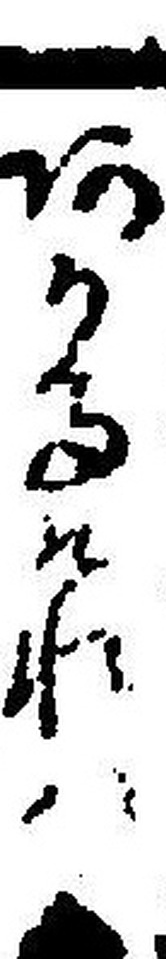あかるければ
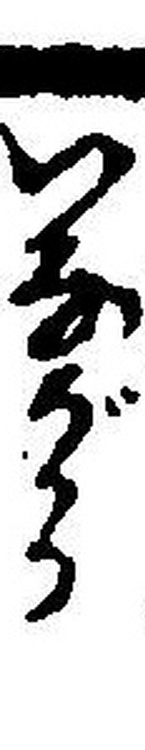いながら
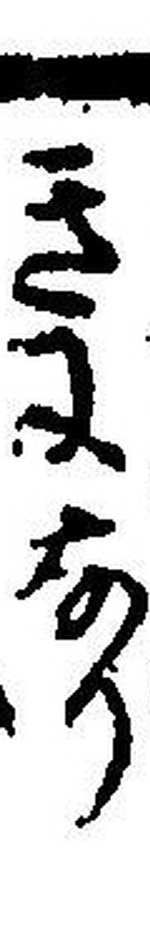きになり
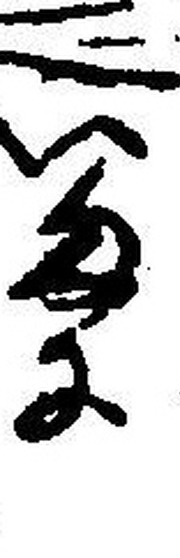いまに
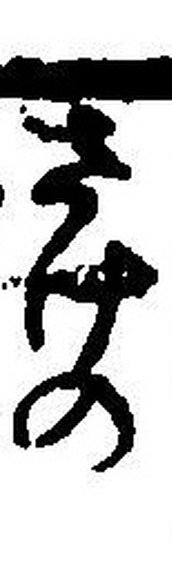さけの
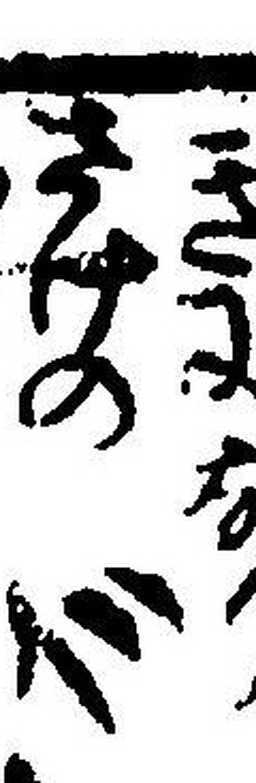さけの
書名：間違狐之女郎買 / 市場通笑作
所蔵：東京大学総合図書館 General Library in the University of Tokyo, JAPAN
